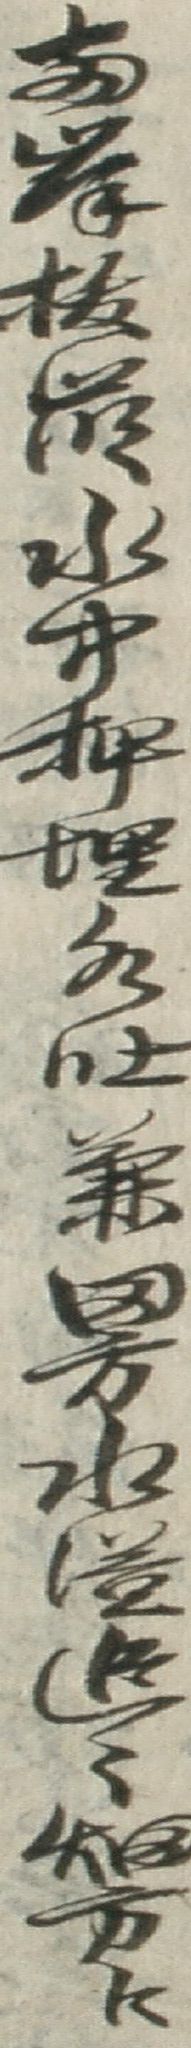両岸抜崩水中押埋水吐兼田方水溢追々畑方江
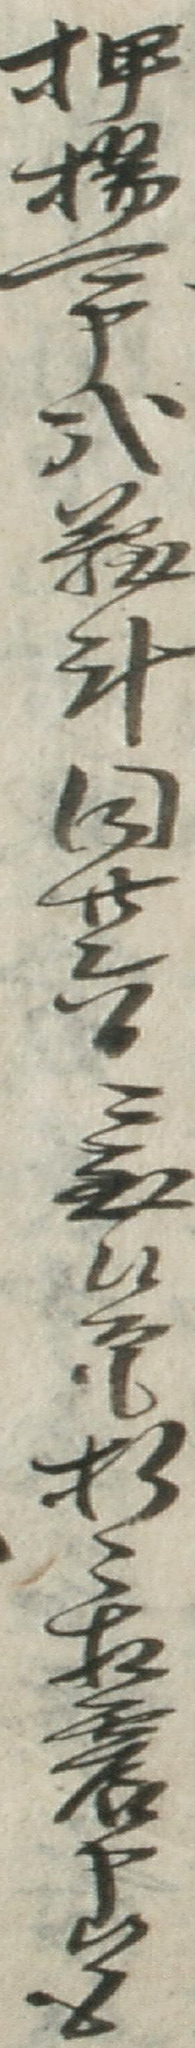押揚可申哉難計同廿六日二至候而も折々相震申候以上
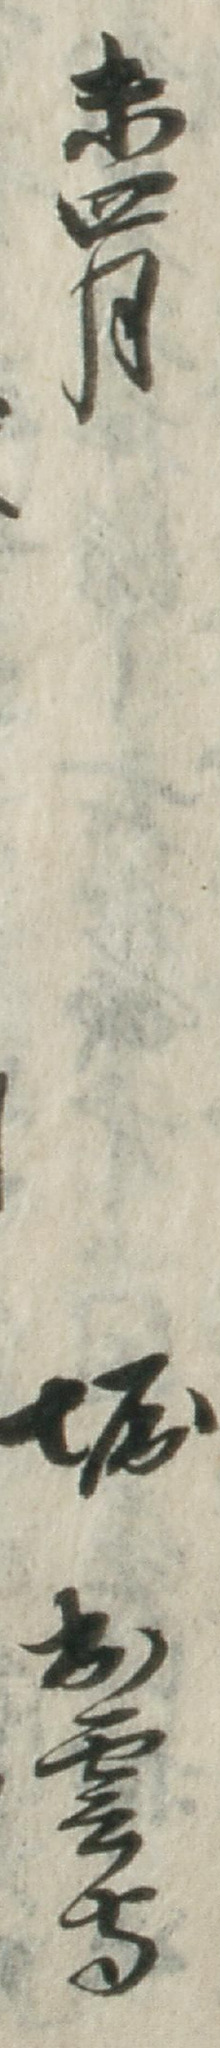未四月堀出雲守
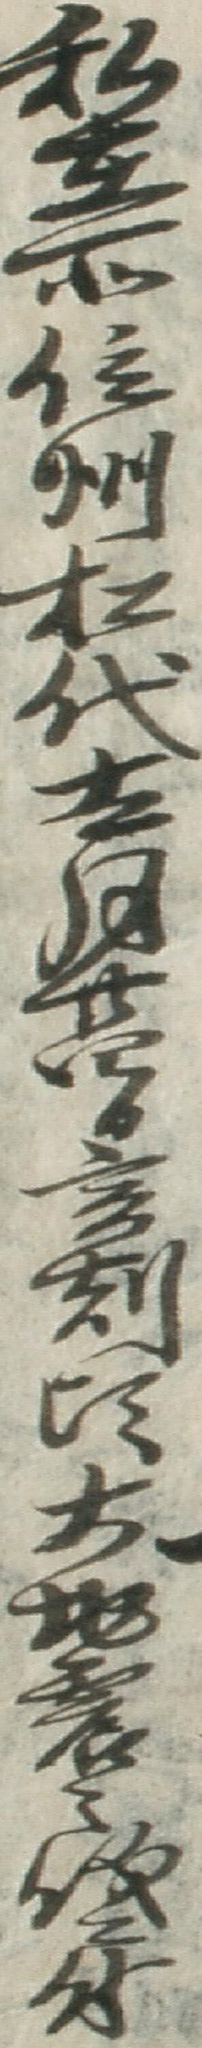私在所信州松代去月廿四日亥刻頃大地震之儀二付
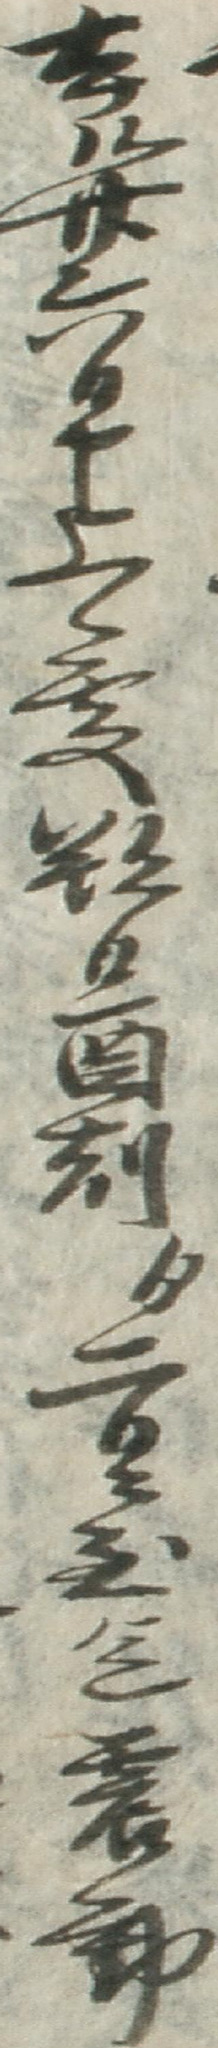去ㇽ廿六日申上候処朔日酉刻ゟ二日二至迄震動
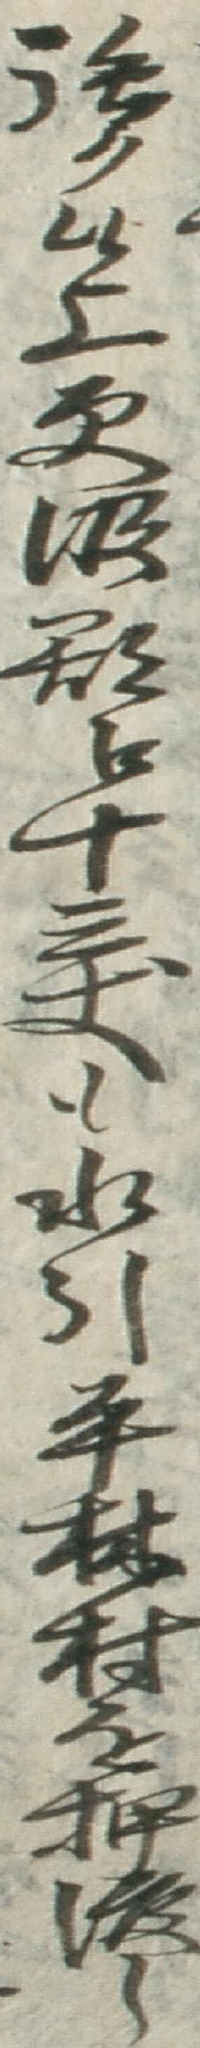強ク候上更級郡江十三丈も水引平林村を押潰し
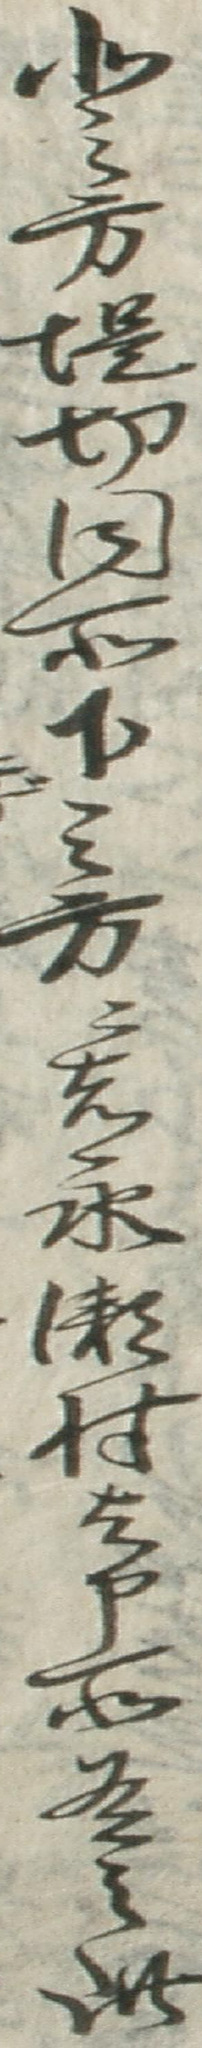北之方堤切同所下之方二は永瀬村と申所有之此
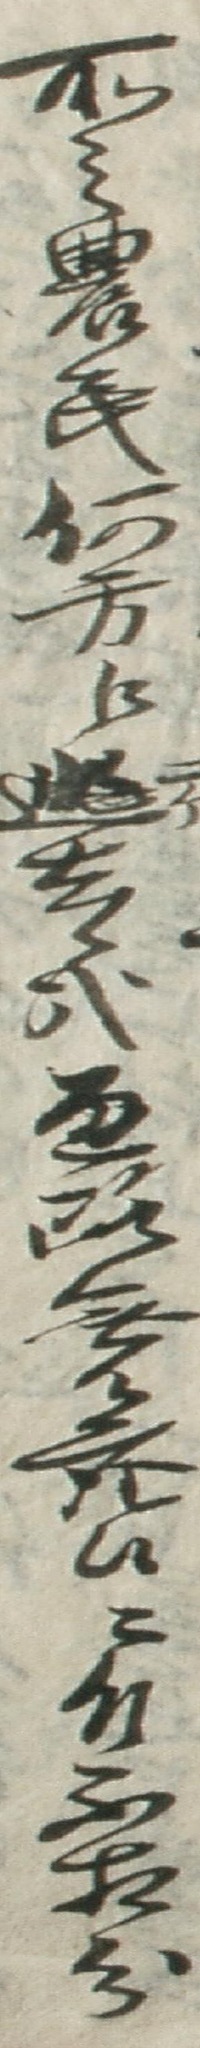所之農民何方江逃去候哉通路無御座候二付不相分
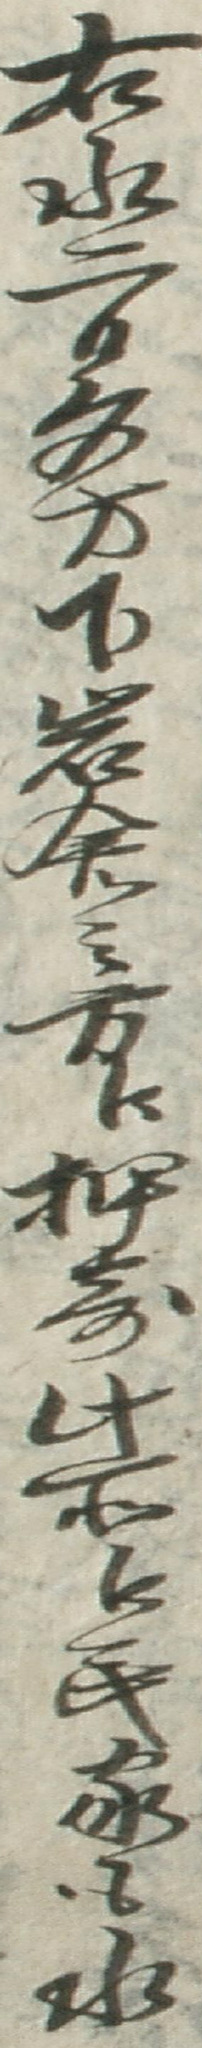右水二日夕方下岩倉之方江押寄此所江民家も水
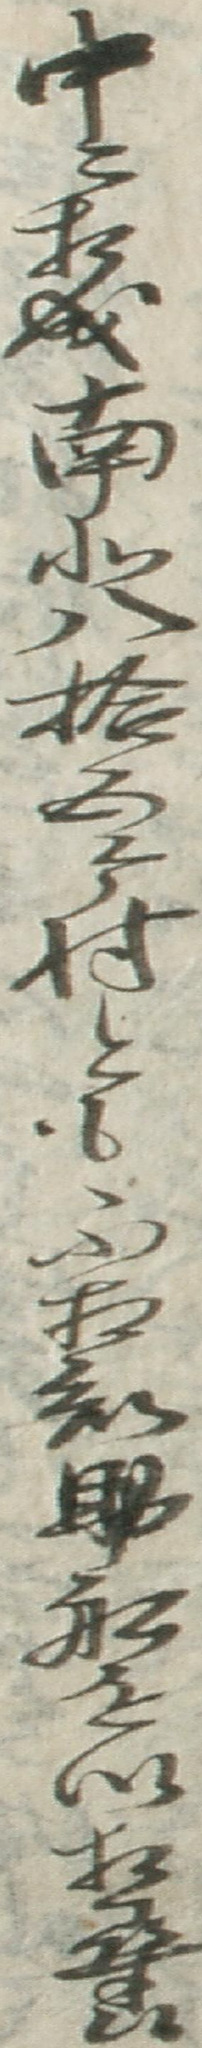中二相成南北八拾五ヶ村とも不相知助船を以相尋候

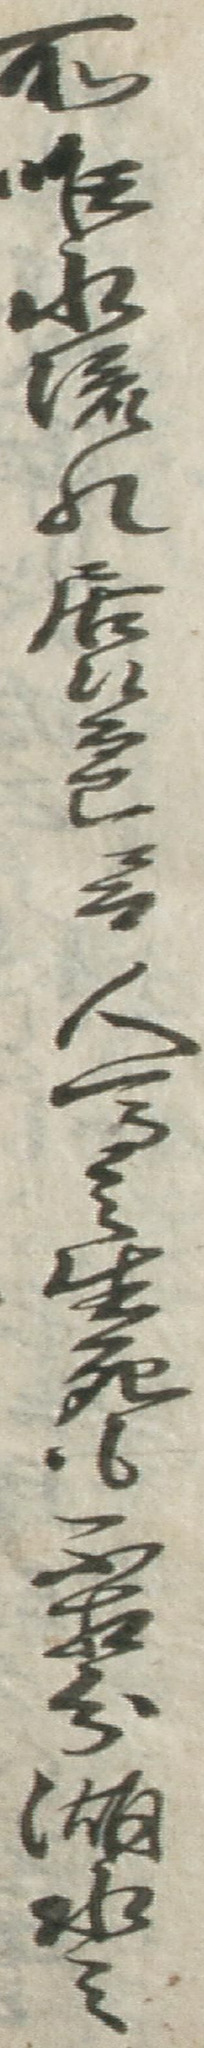所唯水流れ居候而巳二而人馬之生死も不相分湖水之
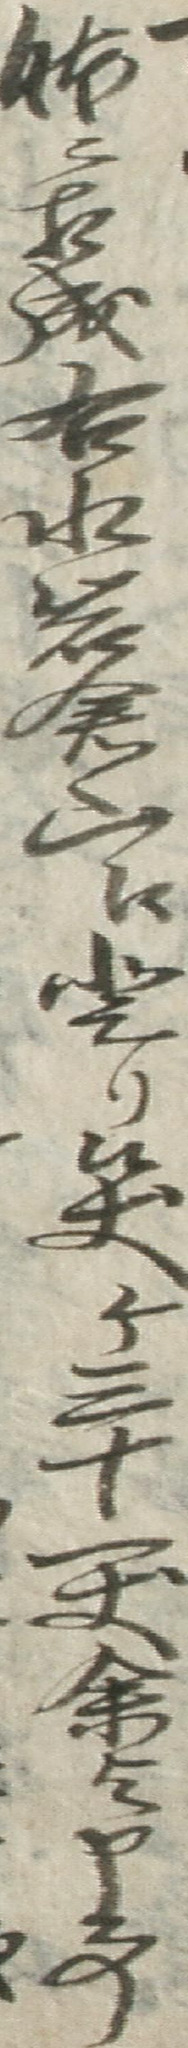躰二相成右水岩倉山江登り候丈ヶ三十一丈余と申事
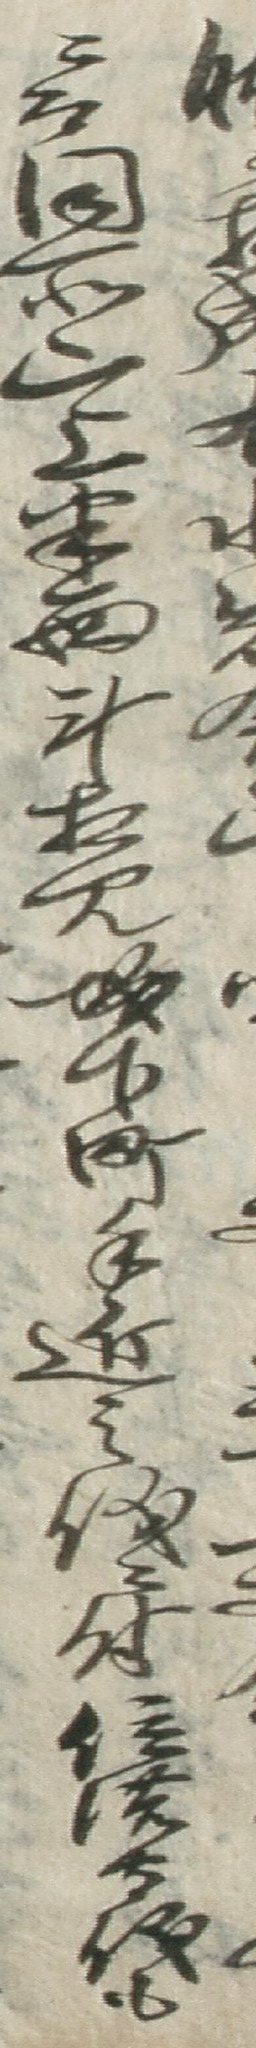二而同所山上半面計相見城下町手近之儀二付信濃守も
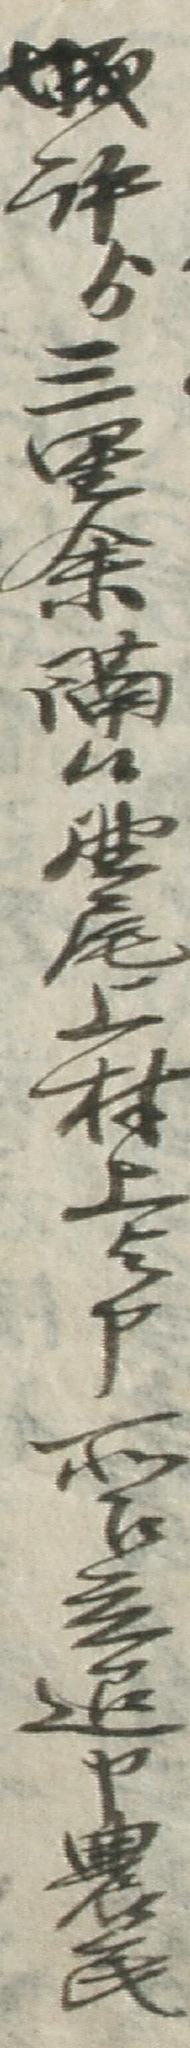城許ゟ三里余隔候曲尾上村上と申所江立退申農民
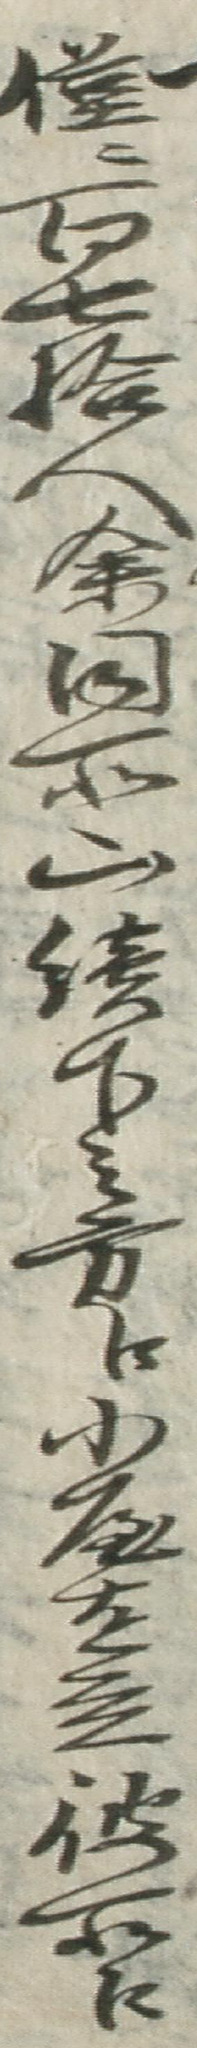僅百七拾人余同所山続下之方江小屋を立彼所江
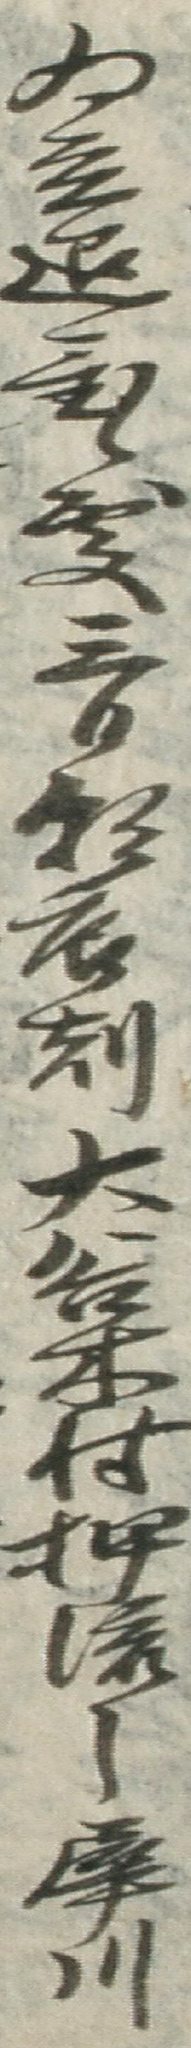為立退置候処三日朝辰刻大谷木材押流し犀川
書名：信濃國地震實録記
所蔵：東京大学地震研究所図書室 Earthquake Research Institute Library, The University of Tokyo, JAPAN
